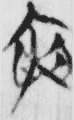寅
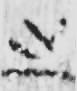之
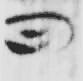日
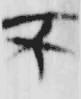不
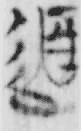𬨭（將）
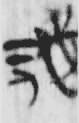○（越）
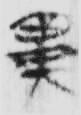異
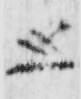之
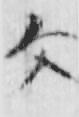大
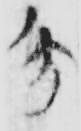帀（師）
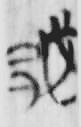○（越）
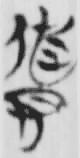儥
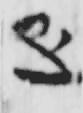疋
